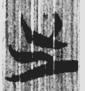之
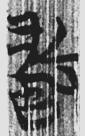敢
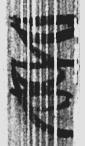韋（違）
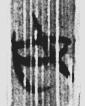女（如）
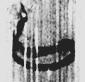㠯
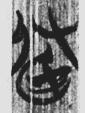○（僕）
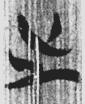之
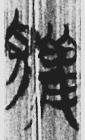觀
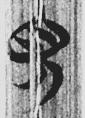○（視）
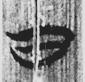日
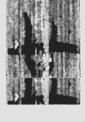也
